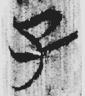子
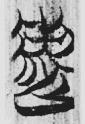遺
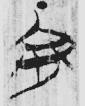余
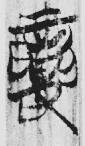婁（鶹）
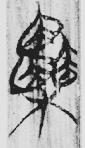○（鷅）
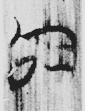含（今）
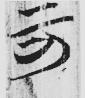可
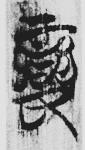婁（鶹）
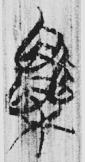○（鷅）
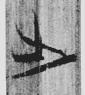之
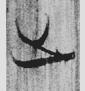止
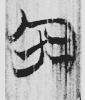含（今）
